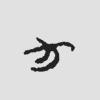方
